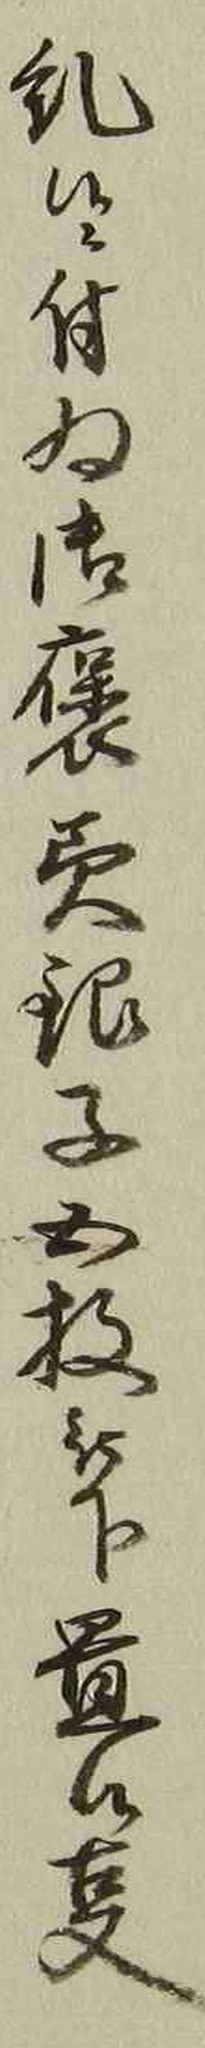糺候ニ付為御褒美銀子五枚被下置候事
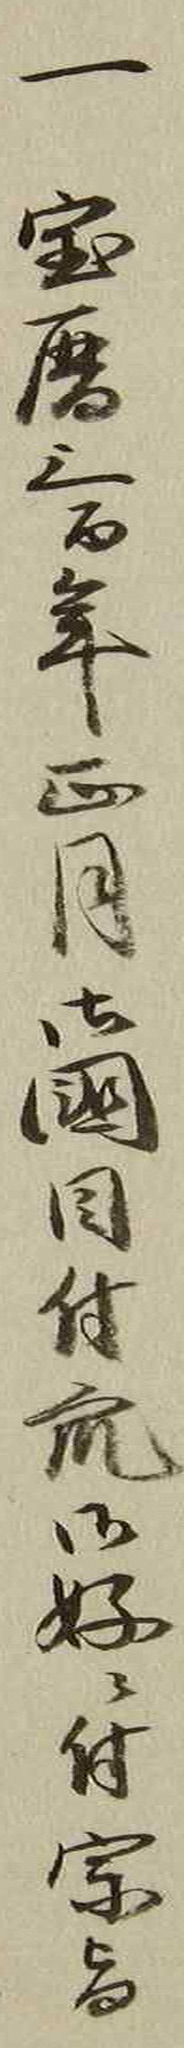一宝暦三酉年正月御国目付衆御好ニ付宗旨
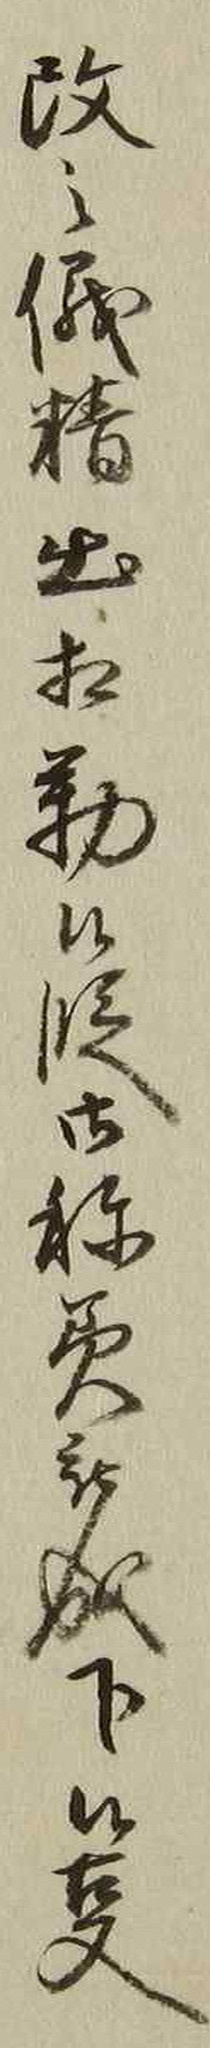改之儀精出相勤候段御称美被成下候事
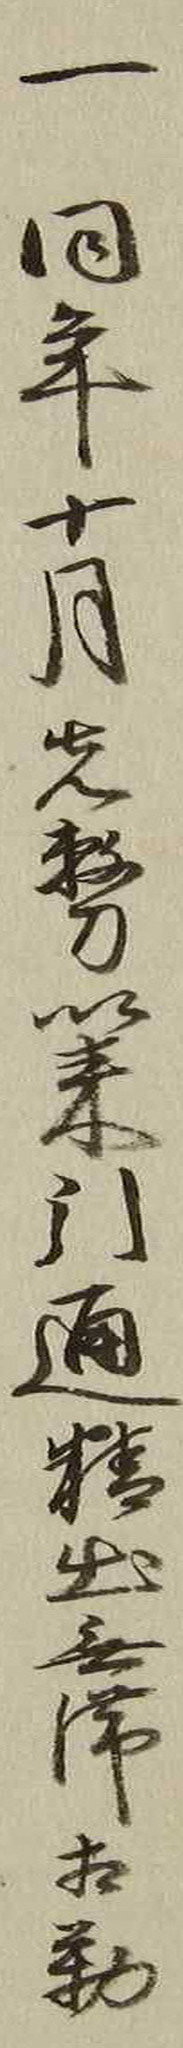一同年十月先務以来引通精出無滞相勤
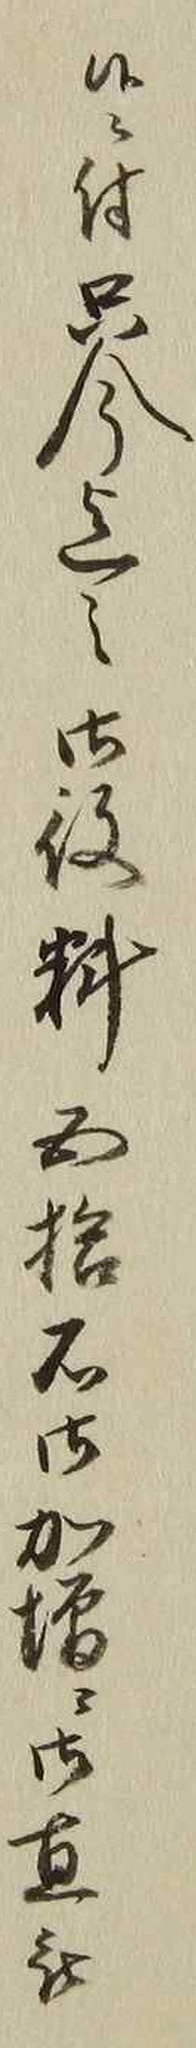候ニ付只今迄之御役料五拾石御加増ニ御直被
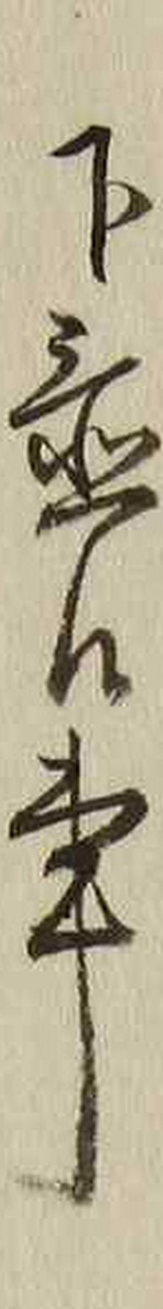下置候事
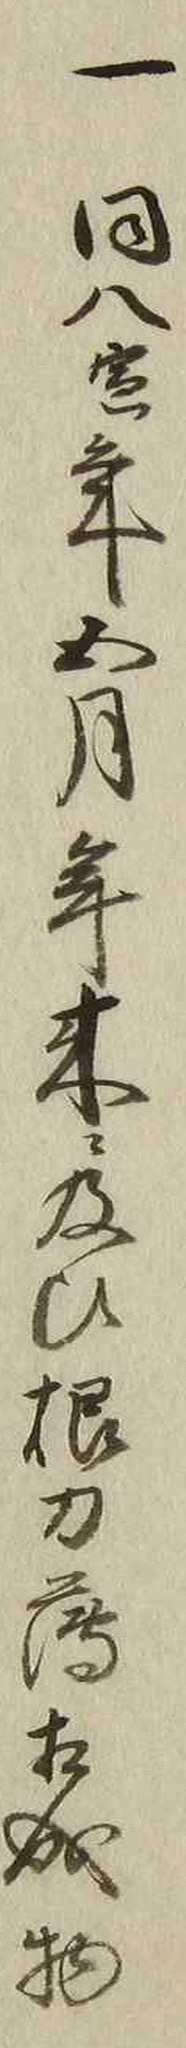一同八寅年五月年来ニ及び根力薄相成物
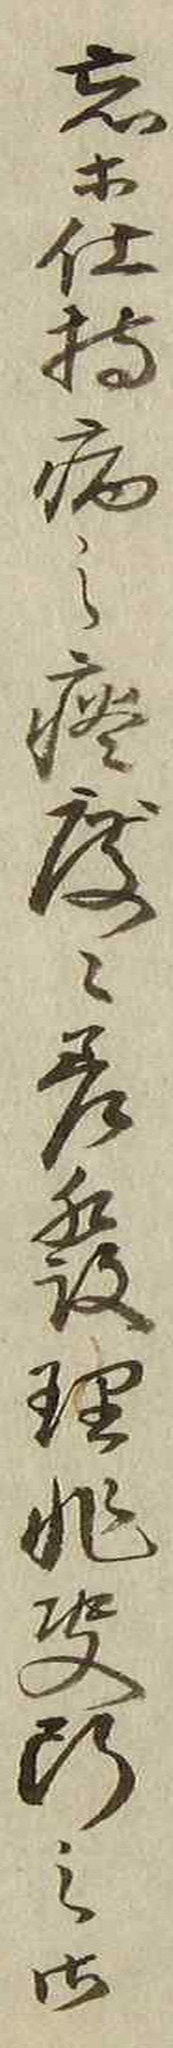忘等仕持病痰度々差発理非決断之御
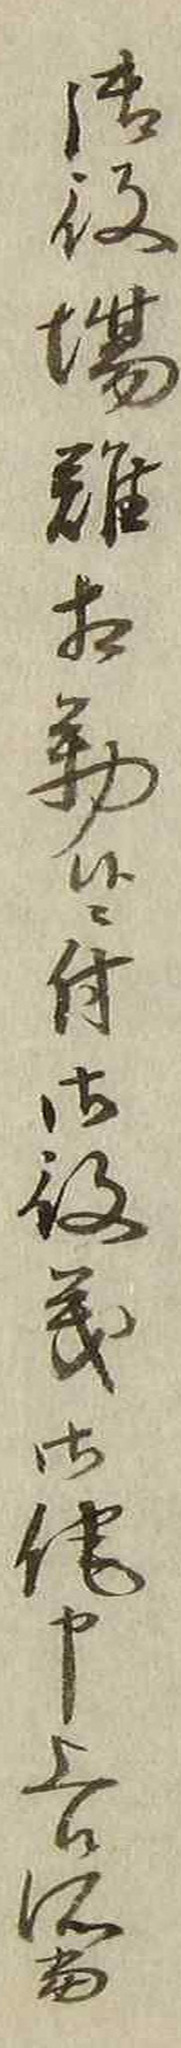御役場難相勤候ニ付御役義御侘申上候所当
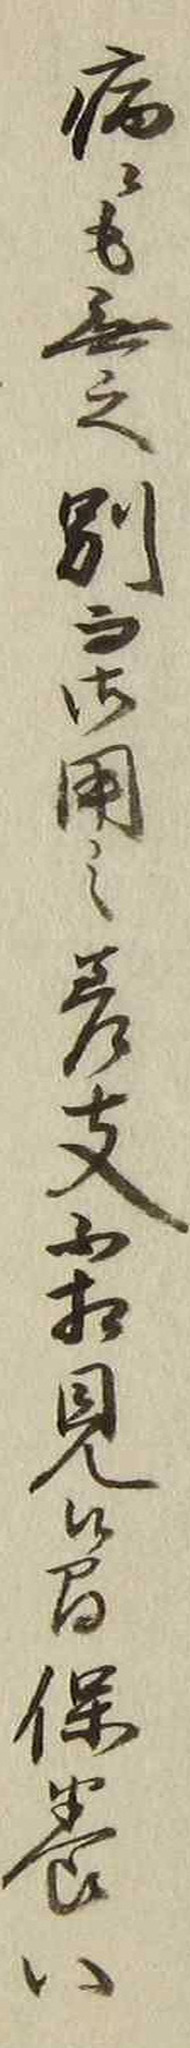病ニも無之別而御用之差支不相見候間保養い
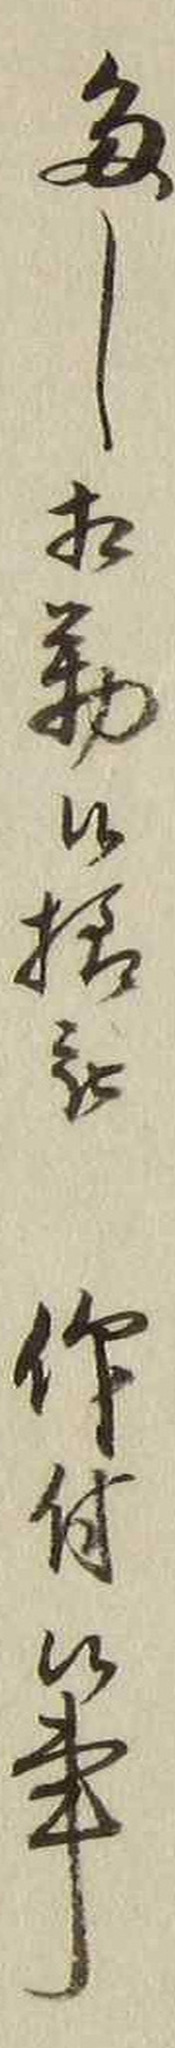たし相勤候様被仰付候事
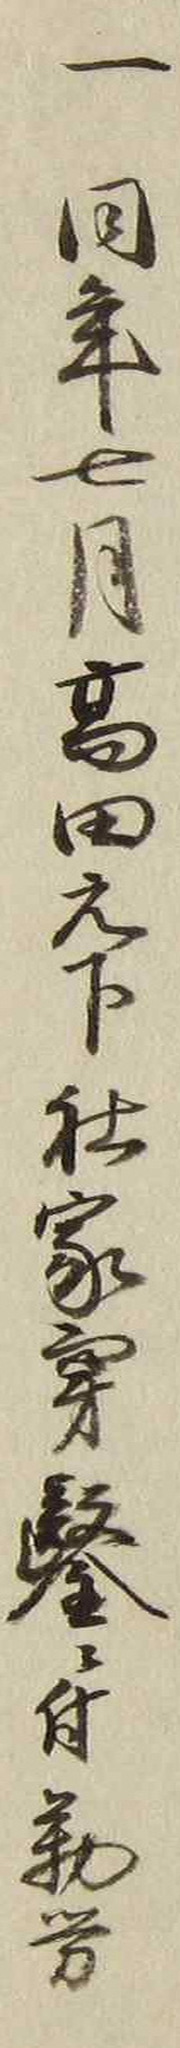一同年七月高田元下社家穿鑿ニ付勤労
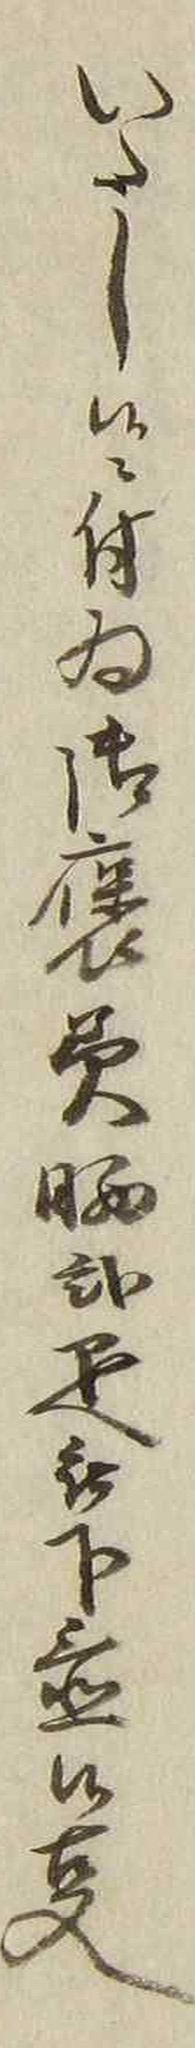いたし候ニ付為御褒美晒弐疋被下置候事
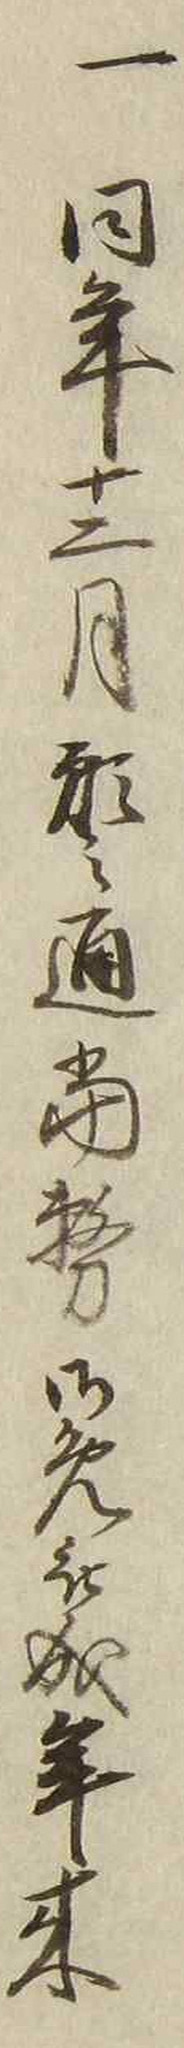一同年十二月願之通当務御免被成年来

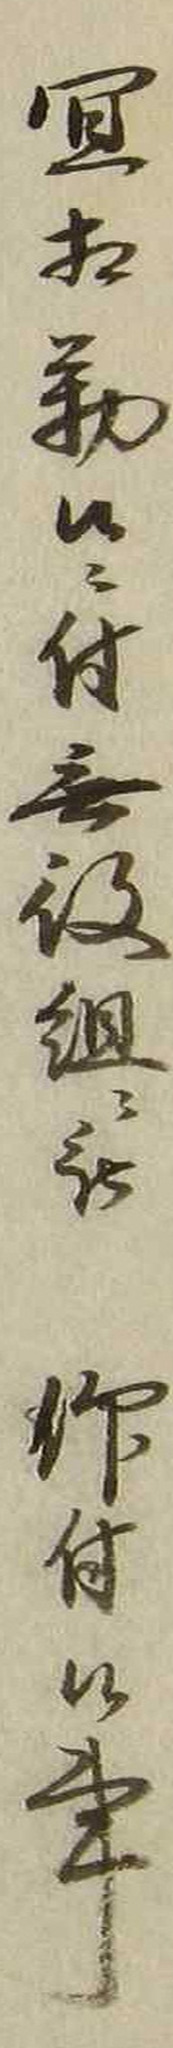宜相勤候ニ付無役組ニ被仰付候事
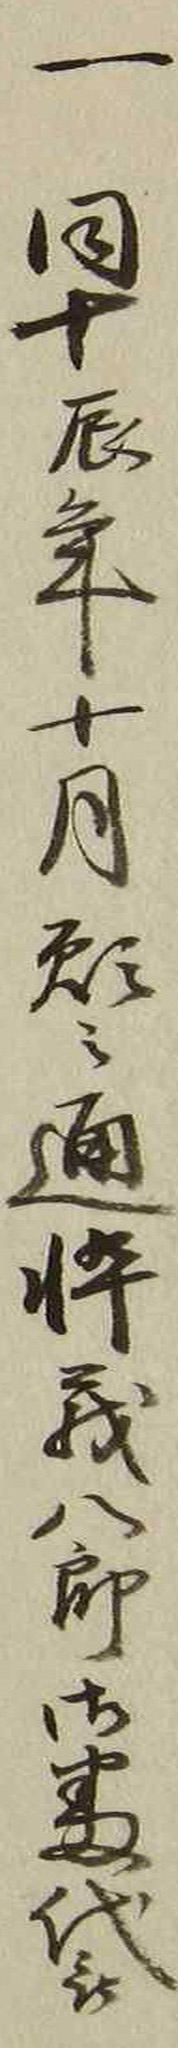一同十辰年十月願之通忰義八郎御番代被
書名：諸士系譜　巻之128　た之部4
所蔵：会津若松市立会津図書館
